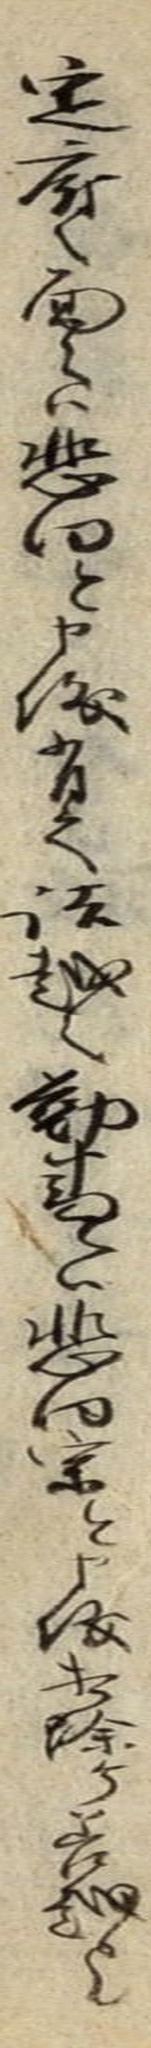一定府之面々は悲田と申儀有之詰越之勤番へは悲田宗と申儀相除け差越申候
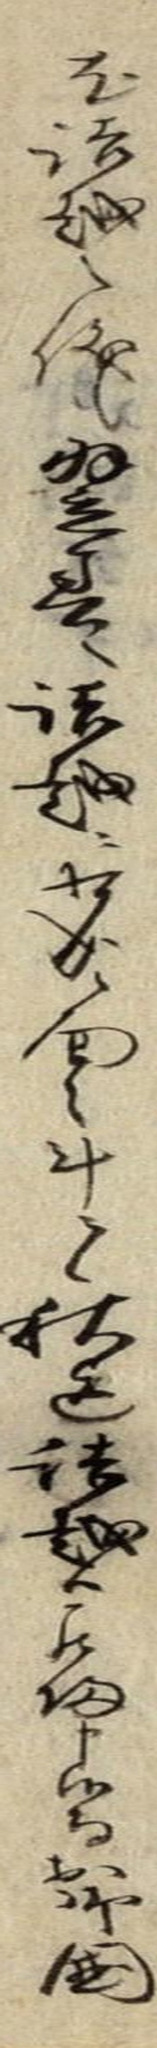尤詰越之儀も翌春へ詰越に相成候面々計に候秋迄詰越は罷帰申候て於御国
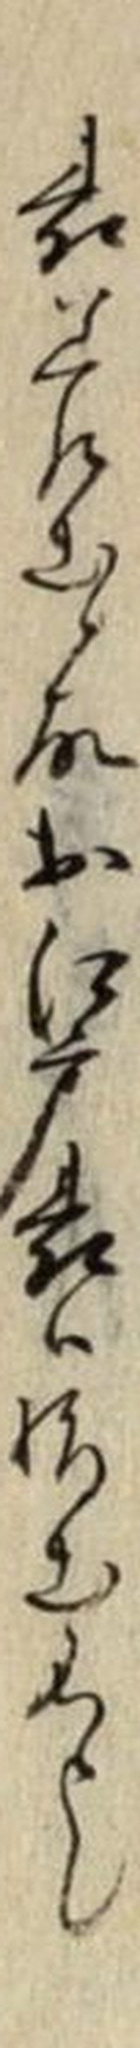表差出候故於江戸表は指出不申候
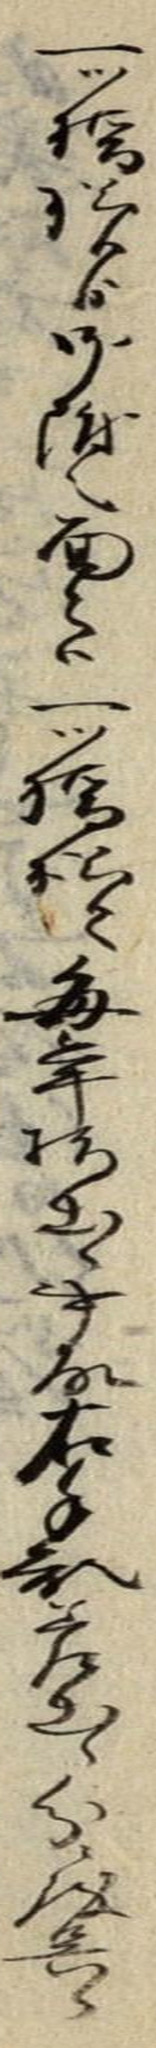一一ツ橋様ゟ御附之面々は一ツ橋様へ毎年指出候事故右手形差出候分に致呉候
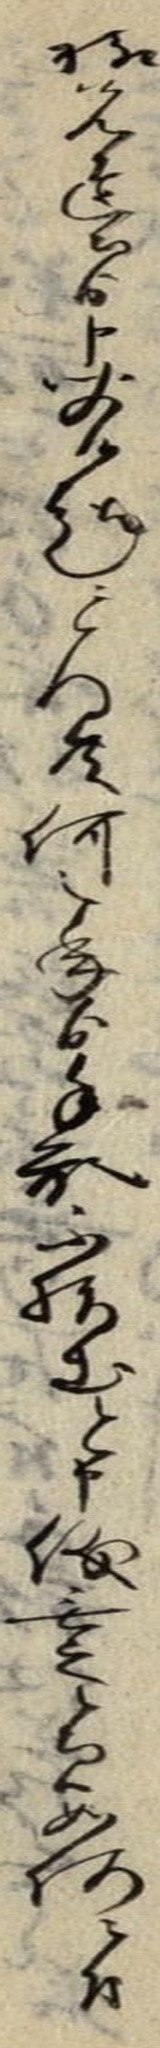様先達てゟ申聞候趣に候得共何之年ゟ手形不指出と申儀無之候ては如何に付
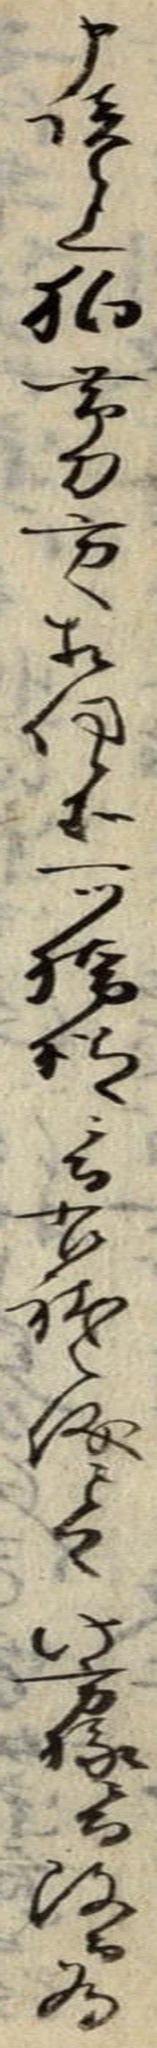申談之上狛帯刀方へ相伺候処一ツ橋様にて右体之儀に候はゝ此方様にて改て為
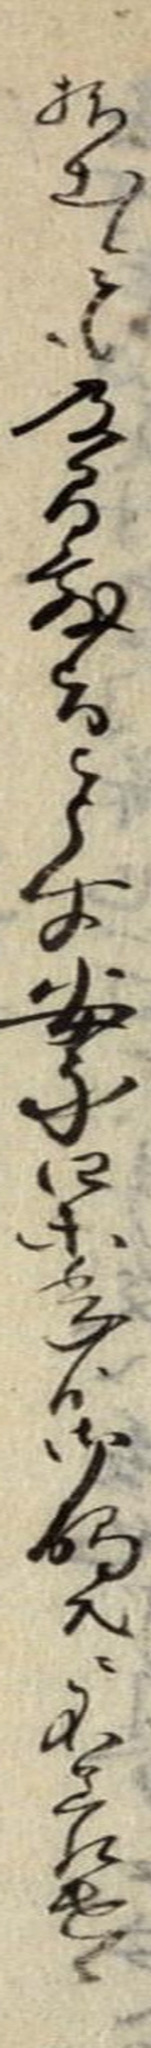指出候にも及間敷旨被申聞安永四未年ゟ御触共に不差遣候
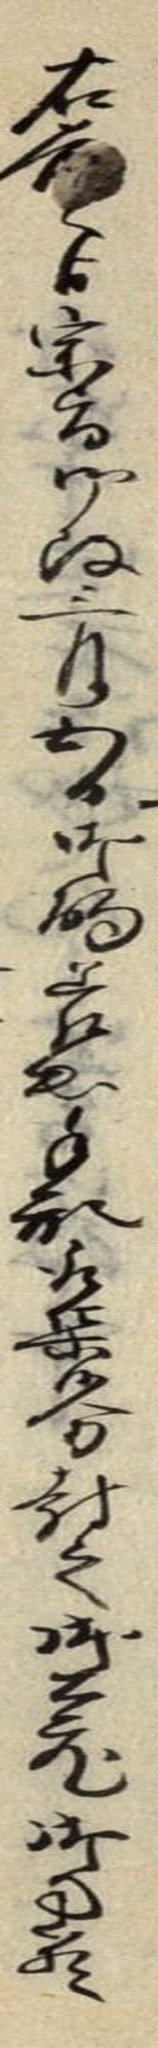一右前々ゟ宗旨御改三月五日御触差出手形取集候分封之御土蔵御用箱
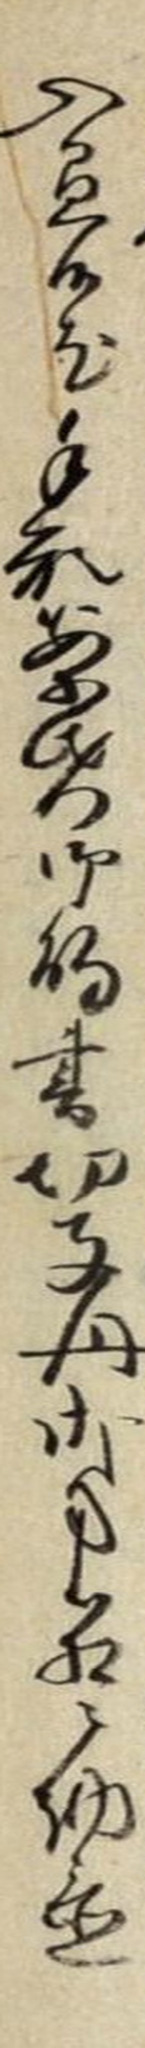入置候尤手形案紙御触書切支丹御用箱に納置
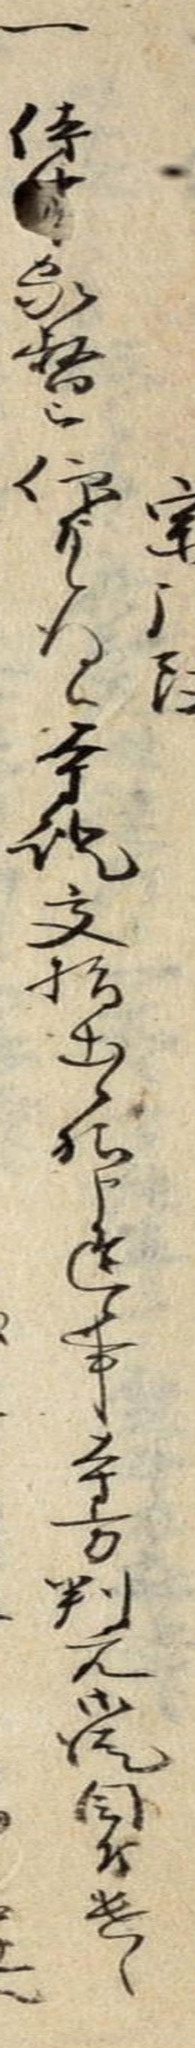一侍中家督被仰付候得は寺證文指出候様申達候事寺方判元御徒目付遣し
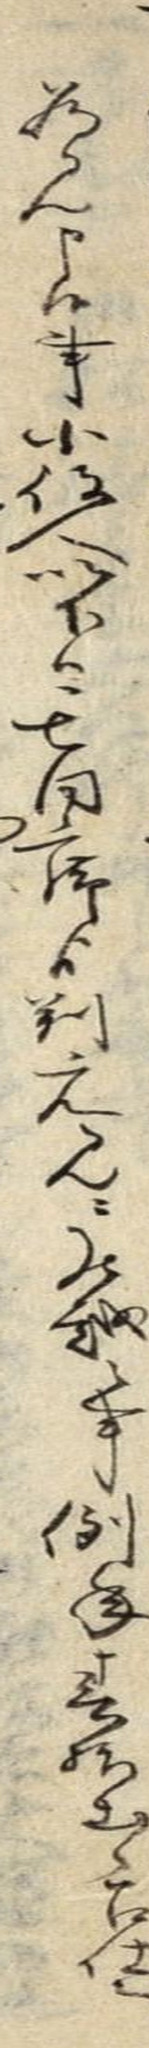為見申候事小役人以下は其同席ゟ判元見に罷越候事例年春指出候召仕之
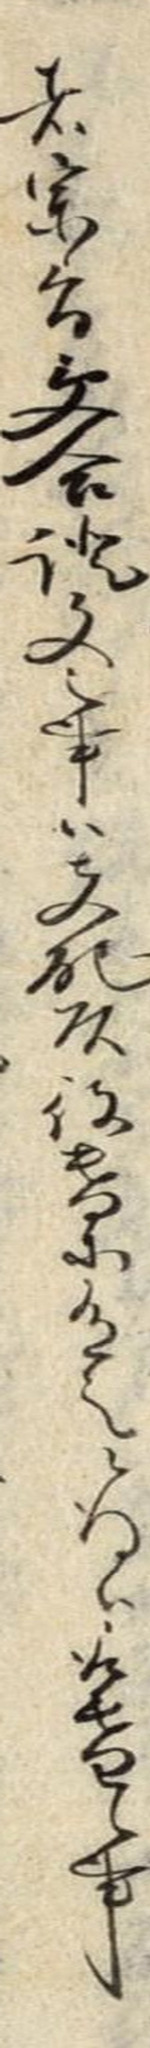者宗旨受合證文之事は支配頭役替等有之候得は取替候事
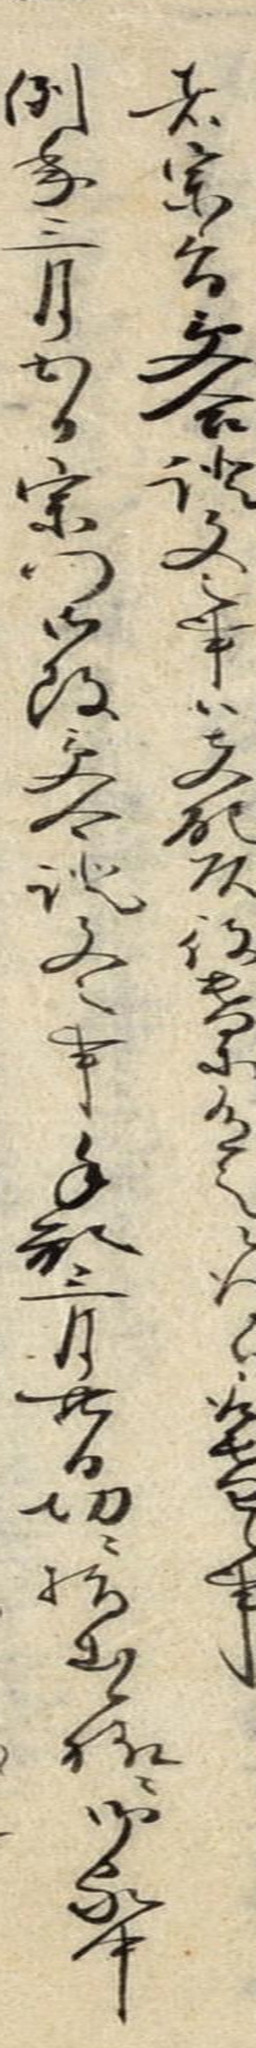一例年三月五日宗門御改受合證文之事手形三月廿日切に指出候様に御家中
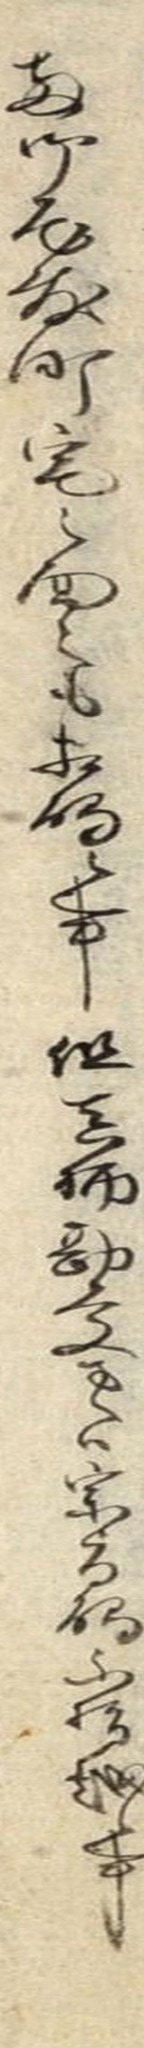両御屋敷町宅之面々も相触候事但真柄勘慶方へは宗旨触不指越候事

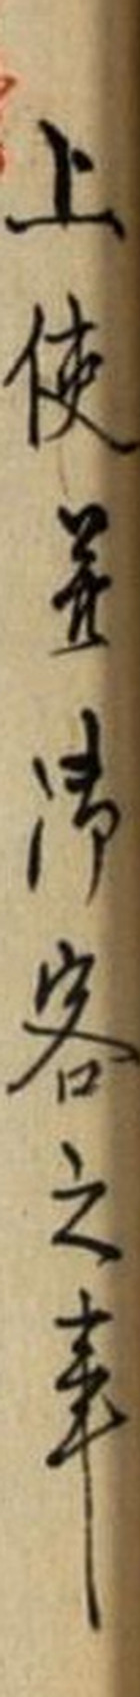上使并御客之事
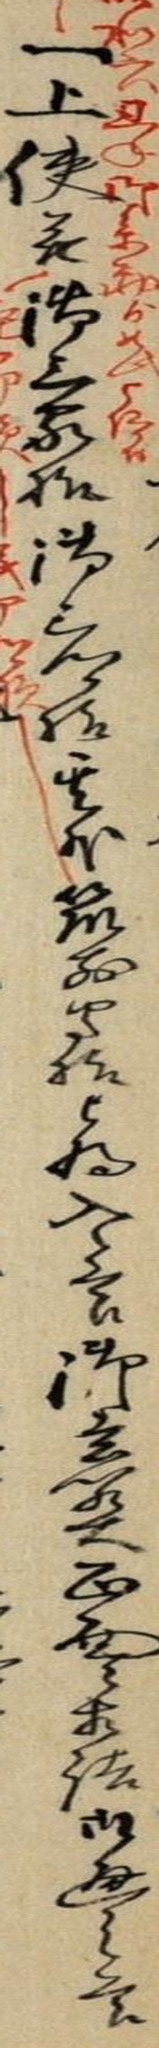一上使并御三家様御三卿様其外筑前守様被為入候節御玄関正面に相詰御通之節
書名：三都并道中之部
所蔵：福井県文書館 Fukui Prefectural Archives
